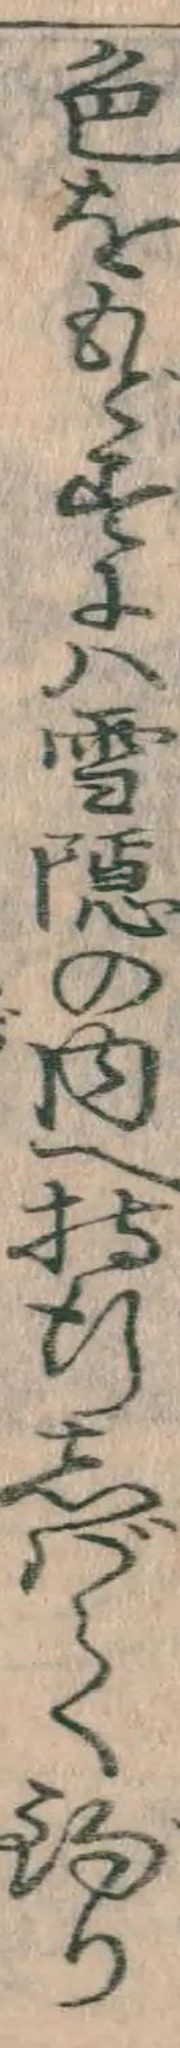色をもどすには雪隠の内へ持行しばらく釣り
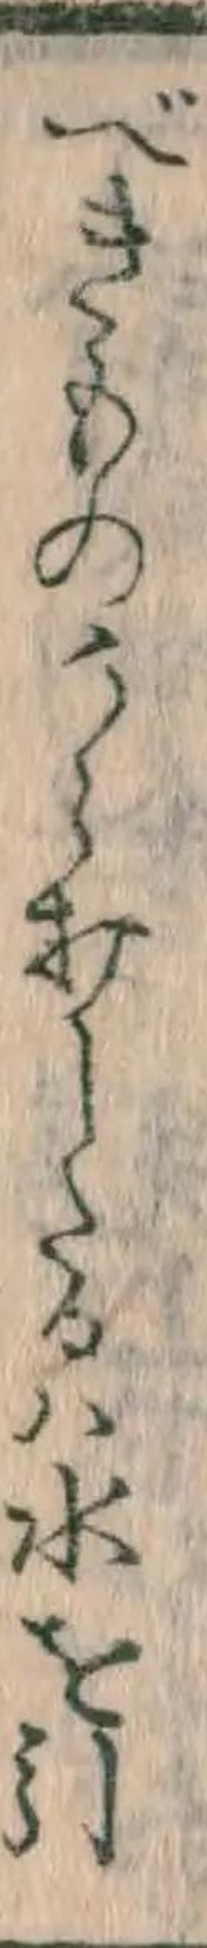べきものから打したるは水を引
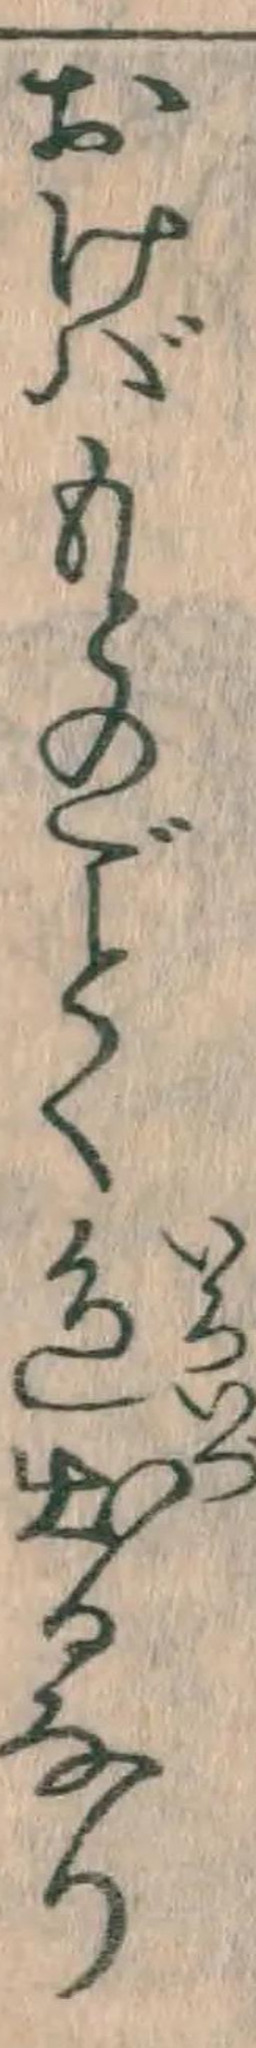おけばもとのごとく色出るなり
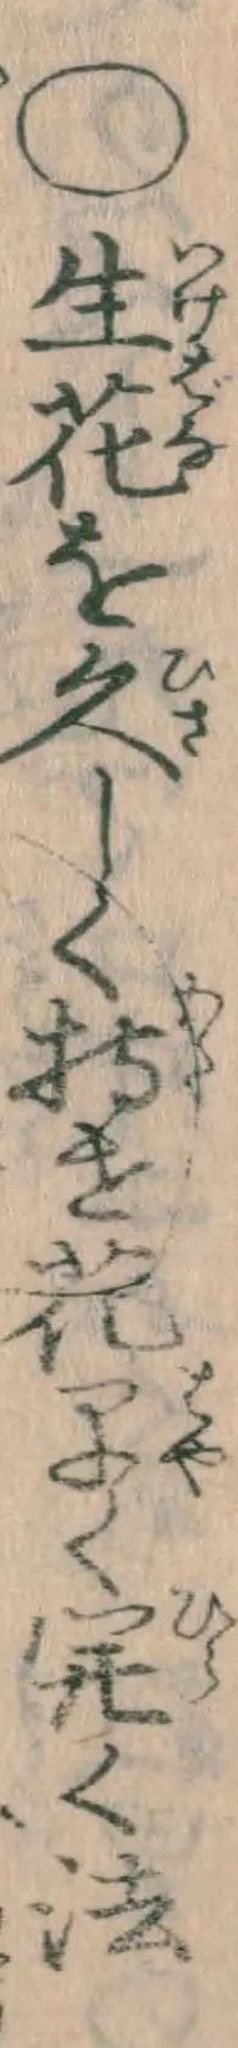○生花を久しく持せ花早く開く法
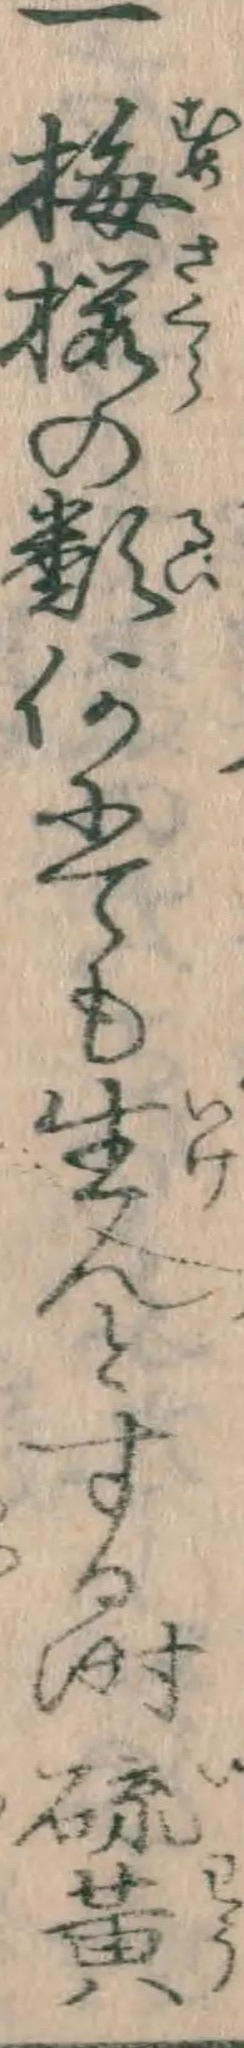一梅桜の類何にても生んとする時硫黄
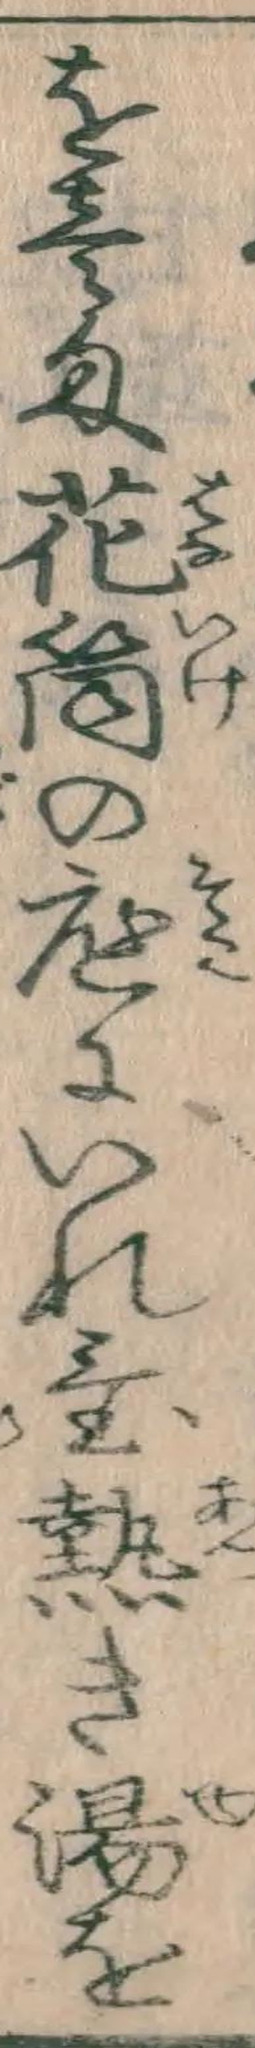を壱匁花筒の底にいれ置熱き湯を
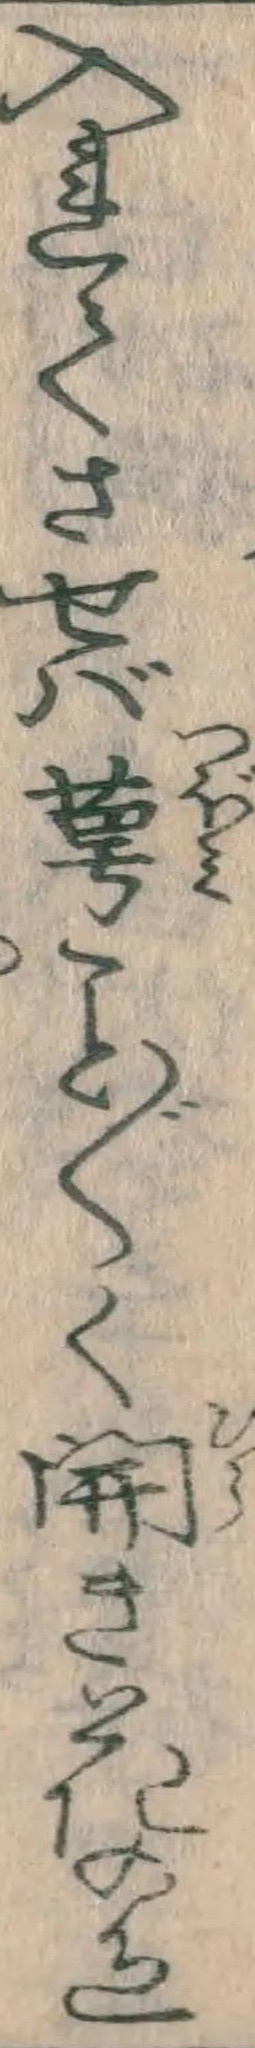入れてさせば萼こと〴〵く開き花の色
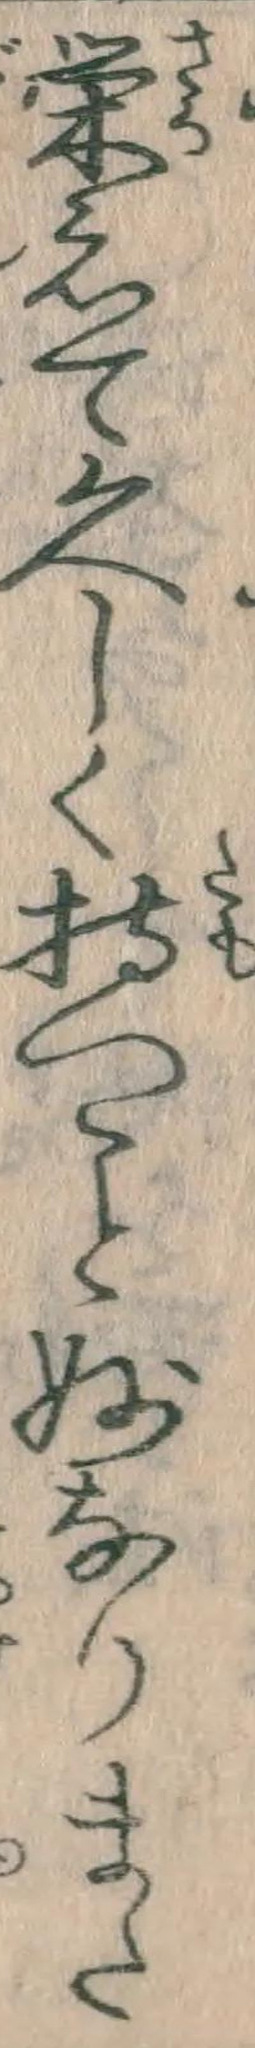栄えて久しく持つこと妙なりまた
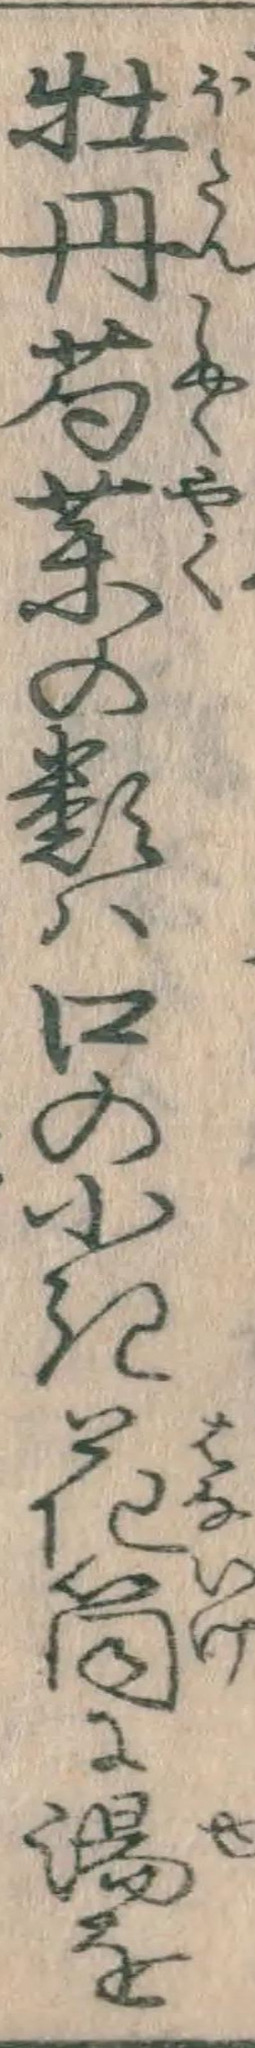牡丹芍薬の類は口の小き花筒に湯を
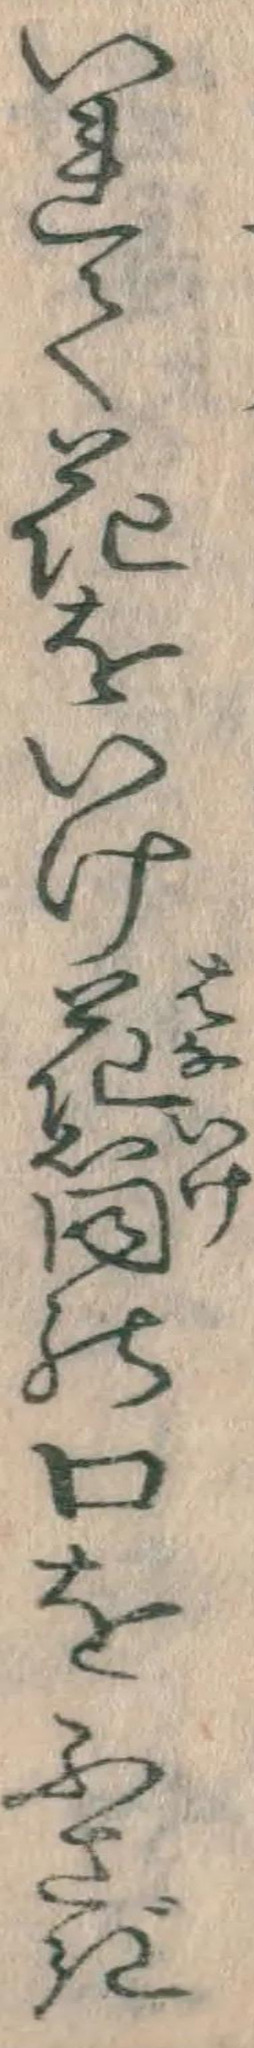いれて花をいけ花筒の口をふさぎ
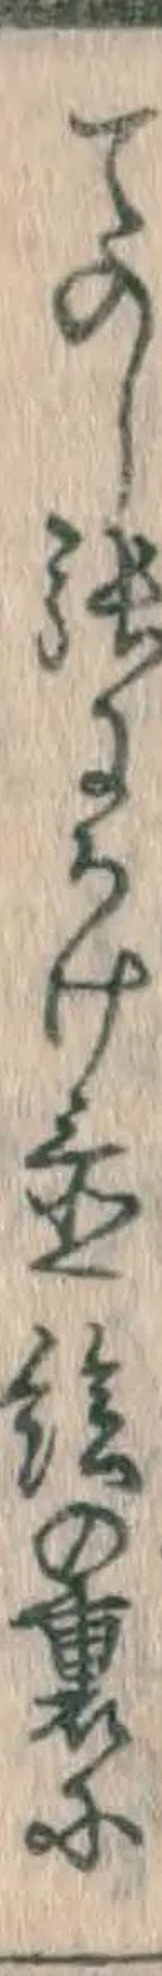てのし張にかけ置絵の裏に
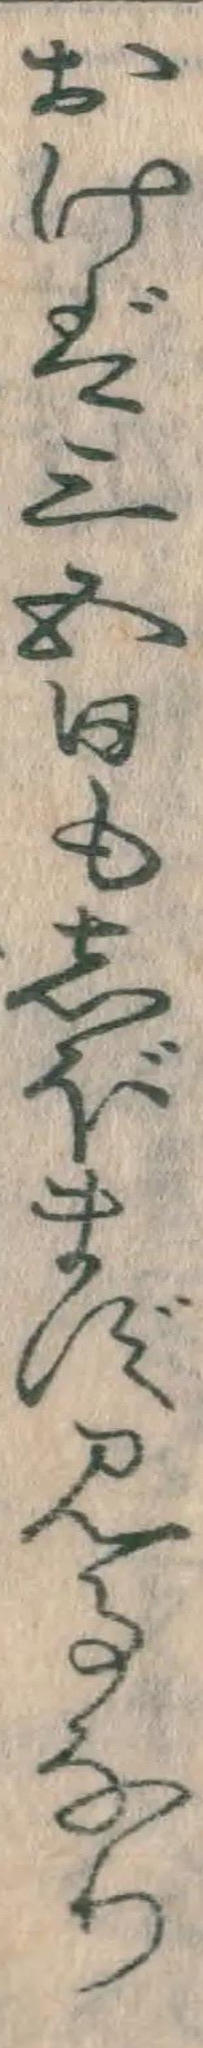おけば三五日もしぼまず見るなり
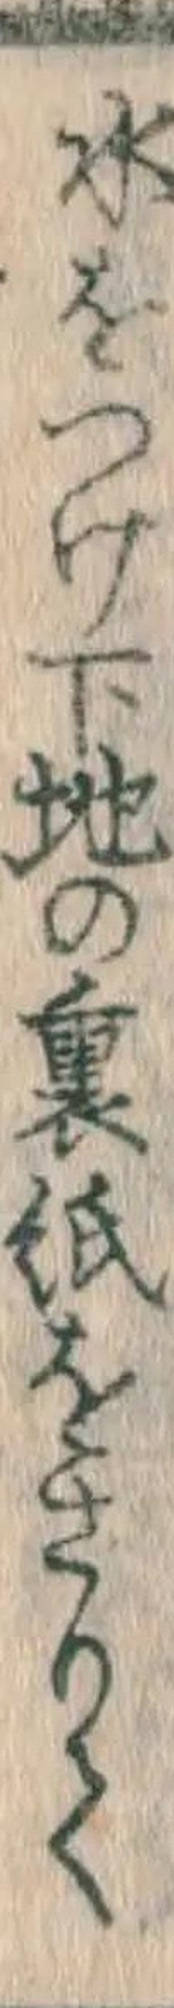水をつけ下地の裏紙をさりて
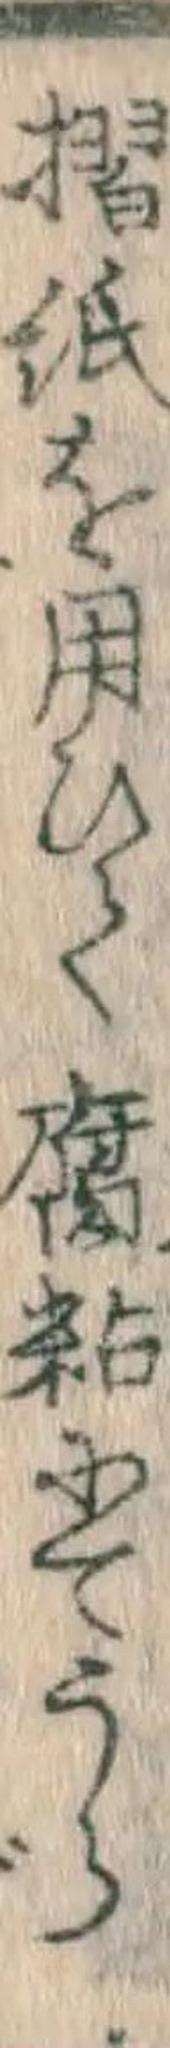摺紙を用ひて腐粘にてうら
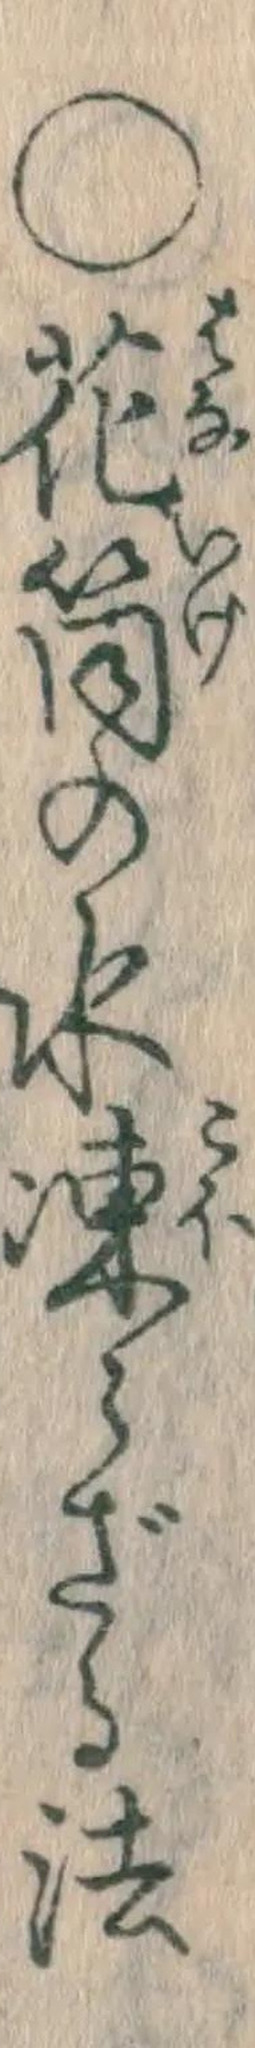○花筒の水凍らざる法
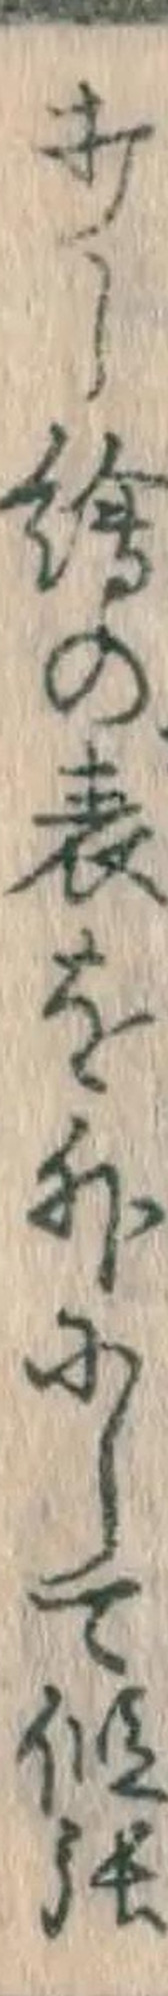打し絵の表を外にして假張
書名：広益秘事大全 3巻. [2]
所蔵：国立国会図書館 National Diet Library, JAPAN
